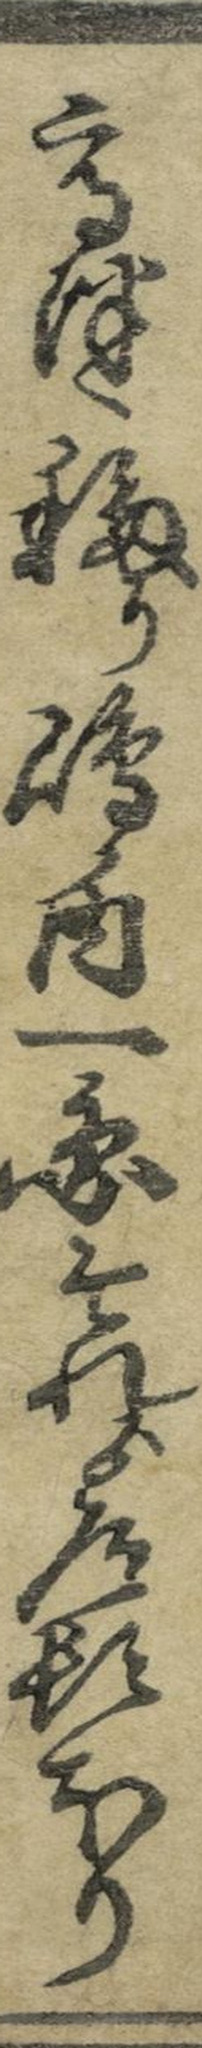高津へ移り嶋之内一円それゟ道頓ほり
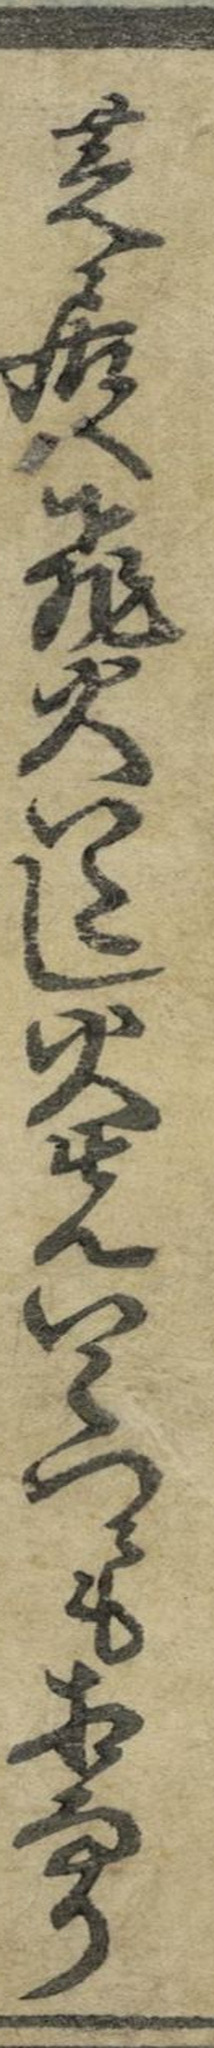芝居へ飛火いたし火先いくつにも相なり
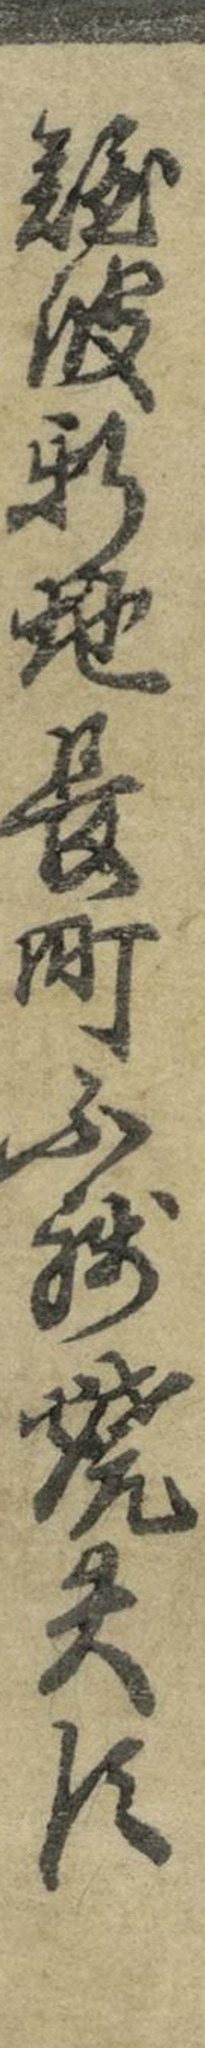難波新地長町不残焼失す
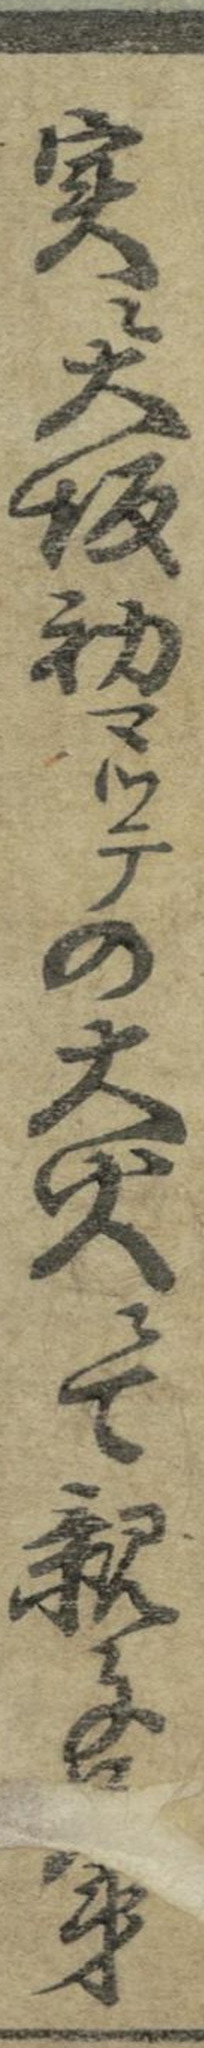実ニ大坂初マツテの大火ニて親子兄弟
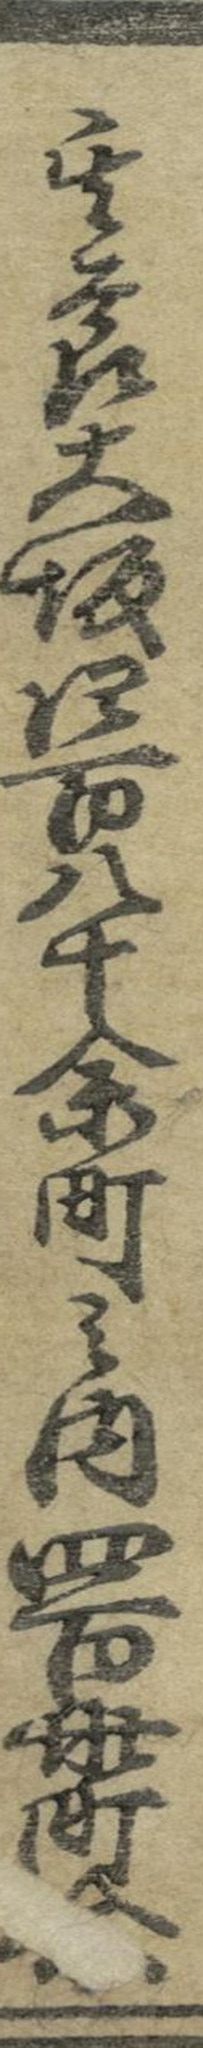其節大坂四百八十余町之内四百卅町余
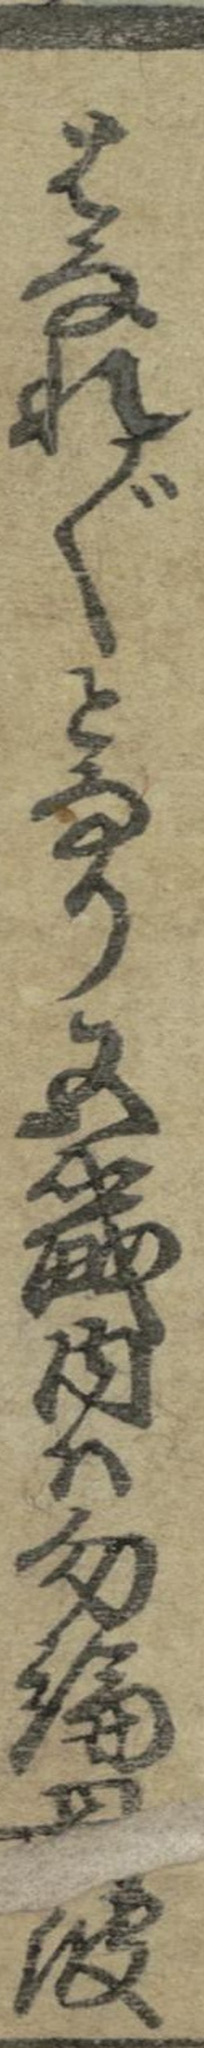はなれ〴〵となり五畿内ハ勿論丹波
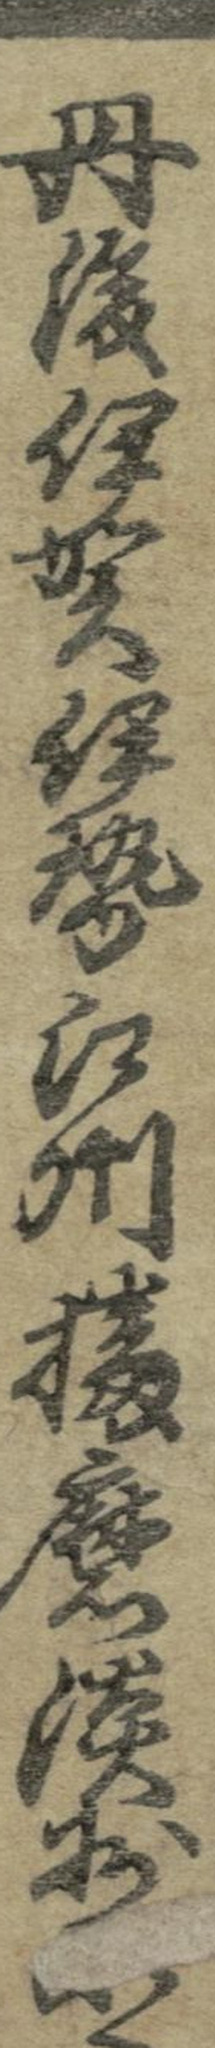丹後伊賀伊勢江州播磨淡州等へ
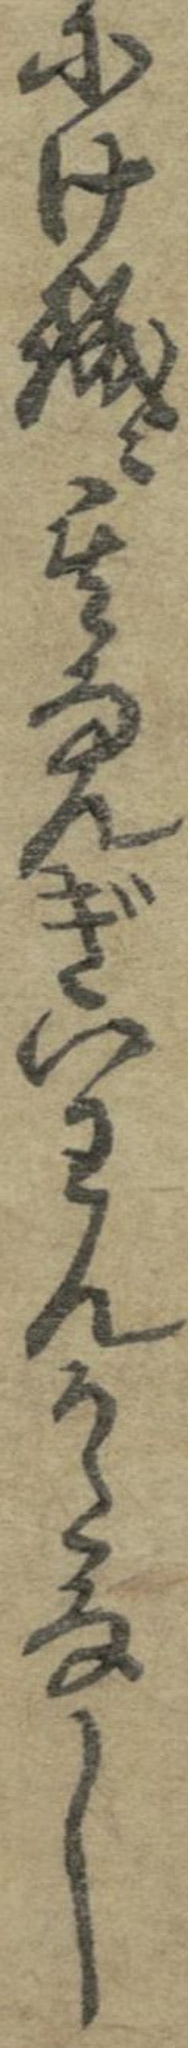にけ誠ニ其なんぎいわんかたなし
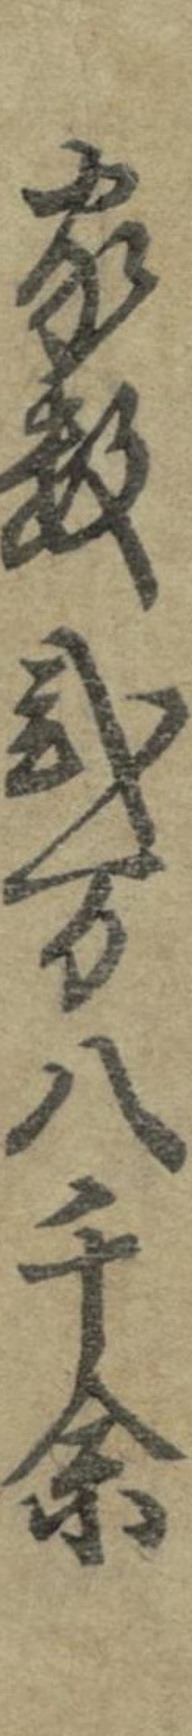家数弐万八千余
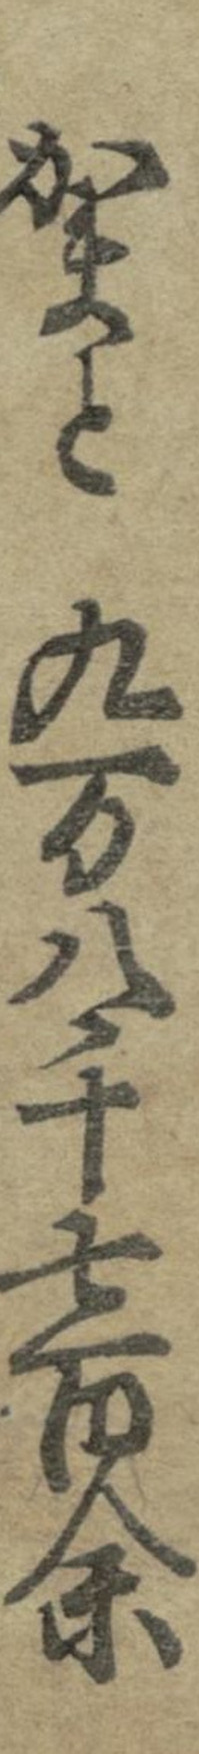かまと九万八千七百余
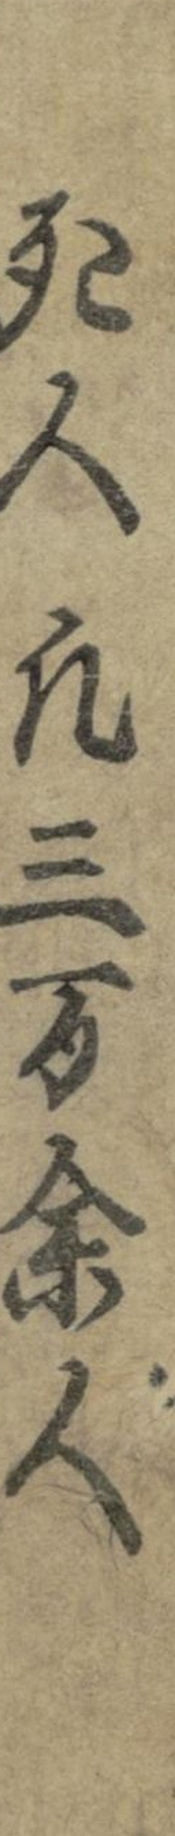死人凡三万余人
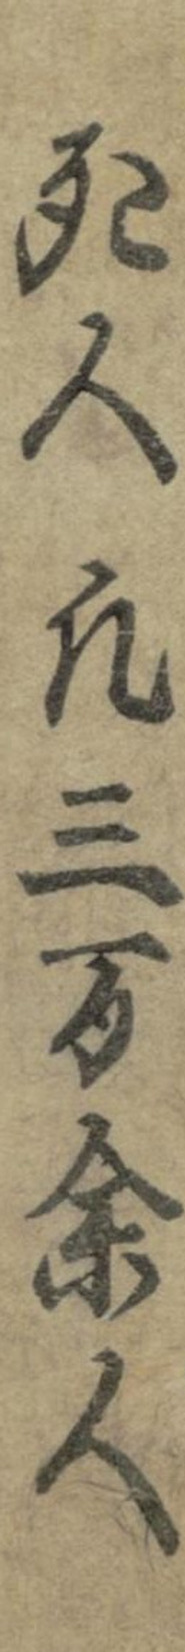死人凡三万余人
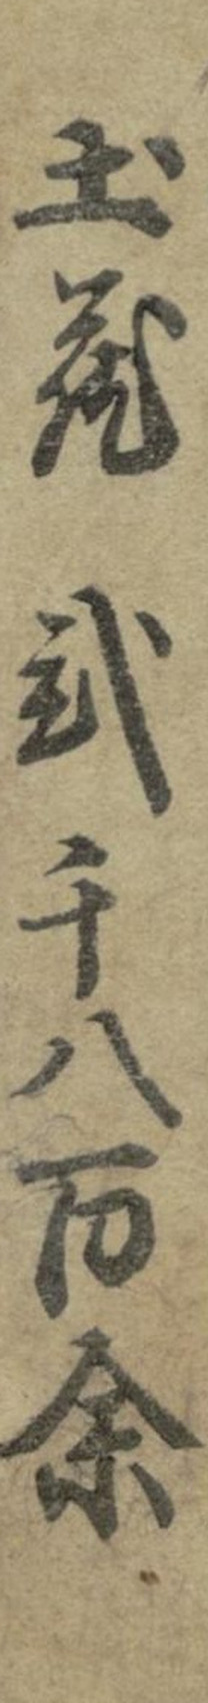土蔵弐千八百余
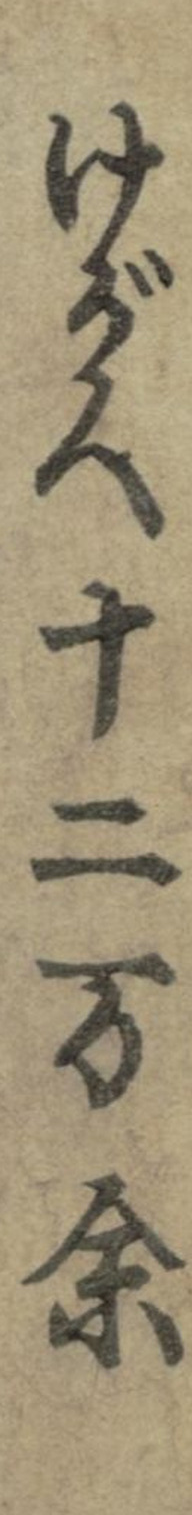けが人十二万余
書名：大阪今昔三度の大火
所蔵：東京大学地震研究所図書室 Earthquake Research Institute Library, The University of Tokyo, JAPAN
